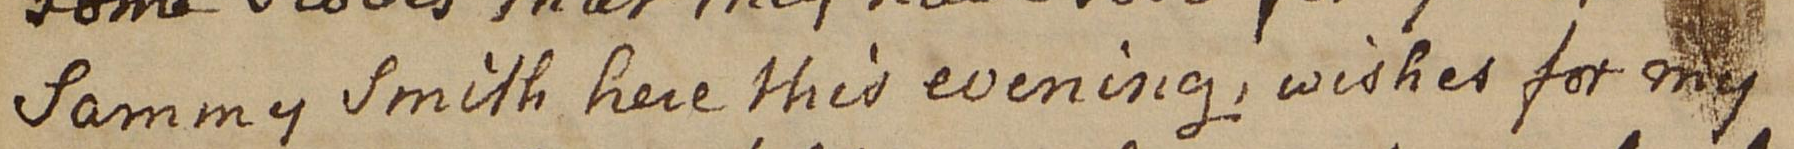Sammy Smith here this evening, wishes for my
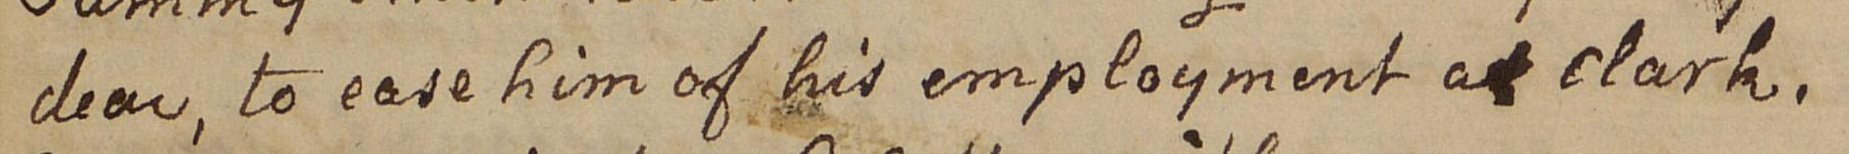dear, to ease him of his employment as clark,
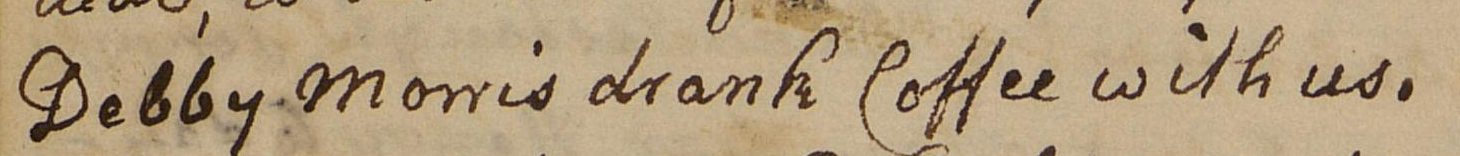Debby Morris drank Coffee with us.
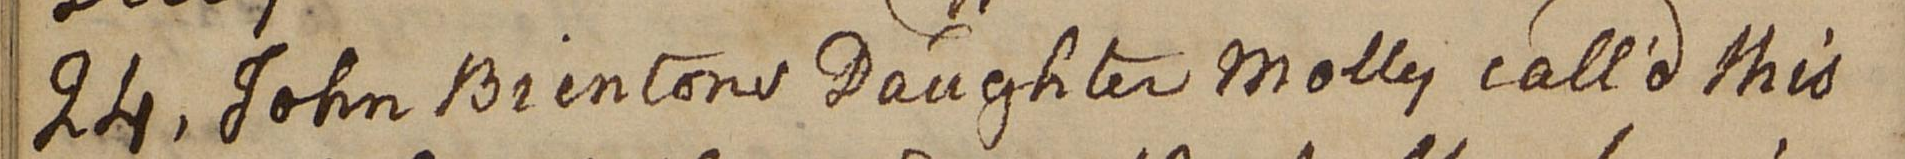24, John Brentons Daughter Molly call'd this
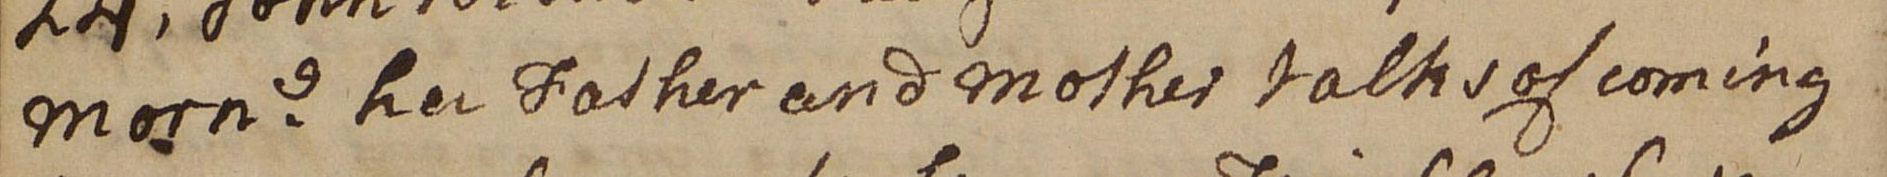morn^g. her Father and Mother talks of coming
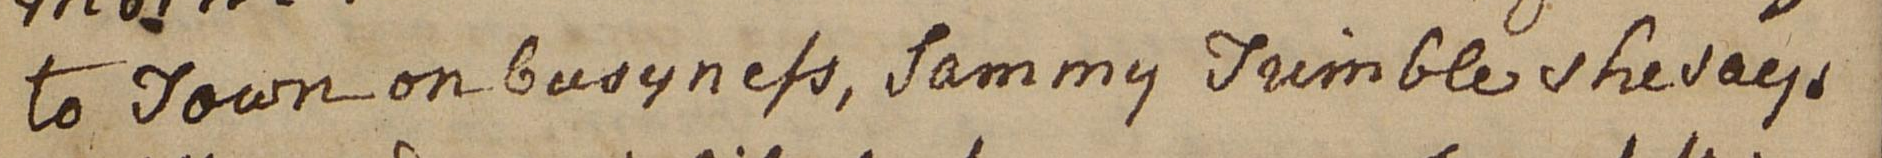to Town on busyness, Sammy Trimble she says
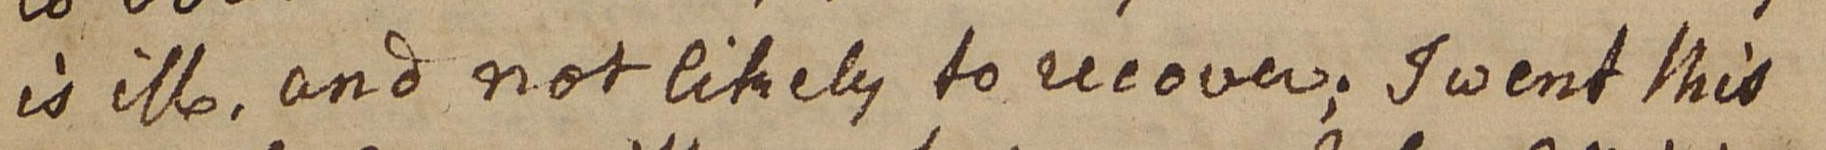is ill, and not likely to recover; I went this
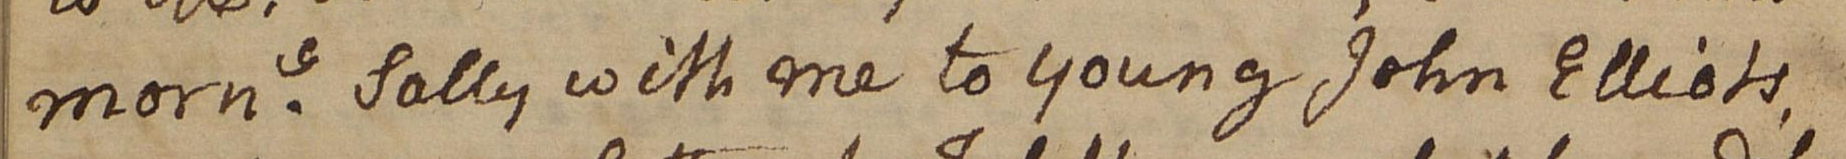morn^g. Sally with me to young John Elliots,
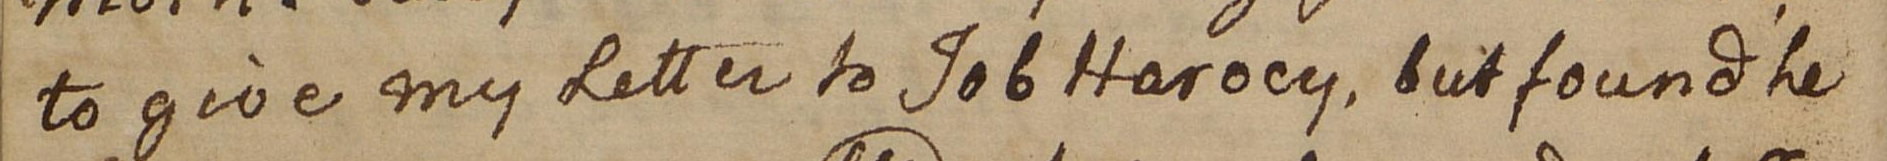to give my Letter to Job Harocy, but found he
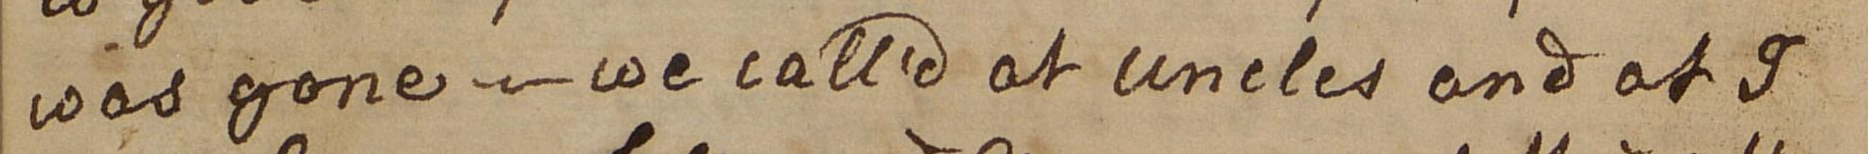was gone- we call'd at Uncles and at I
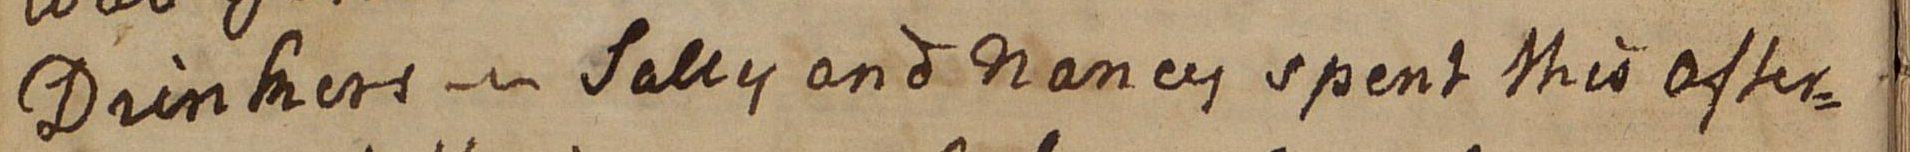Drinkers- Sally and Nancy spent this After-
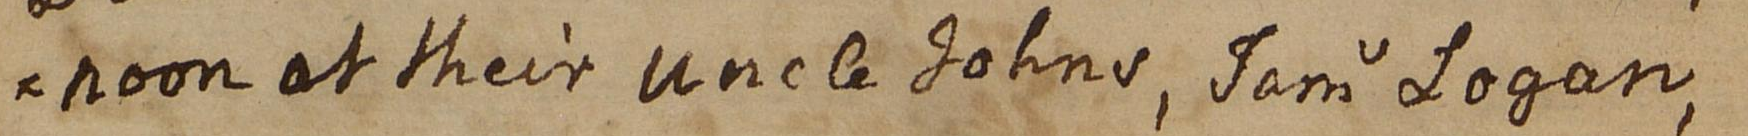-noon at their Uncle Johns, Jam^s Logan,
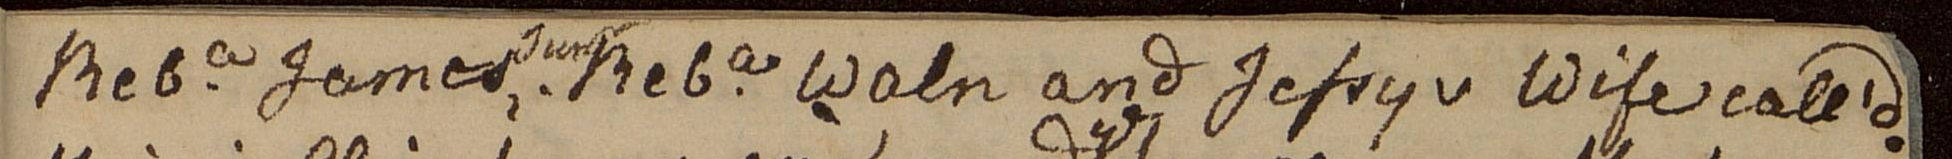Reb^a. James^Jun^r,. Reb^a. Waln and Jessys Wife call'd.
